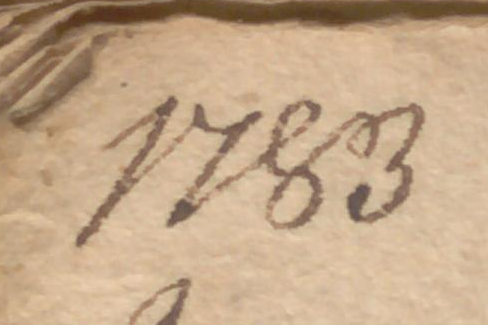1783
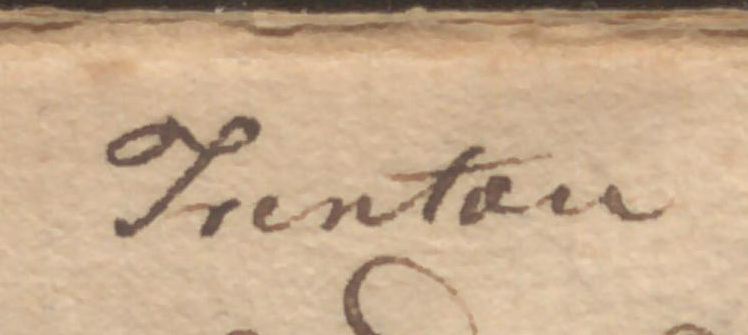Trenton
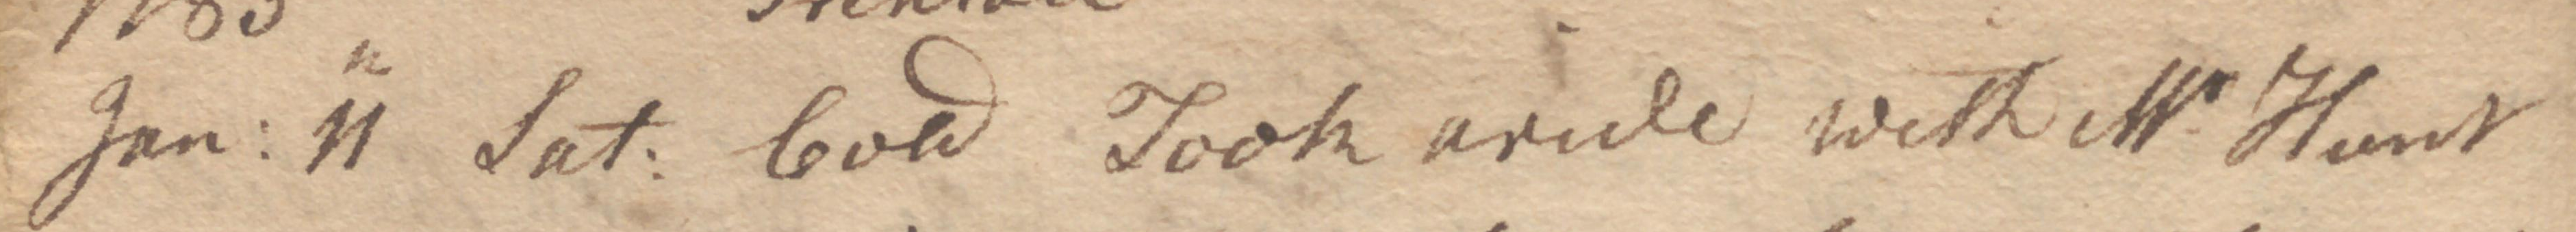Jan: 11^th Sat. Cold Took a ride with M^r. Hunt
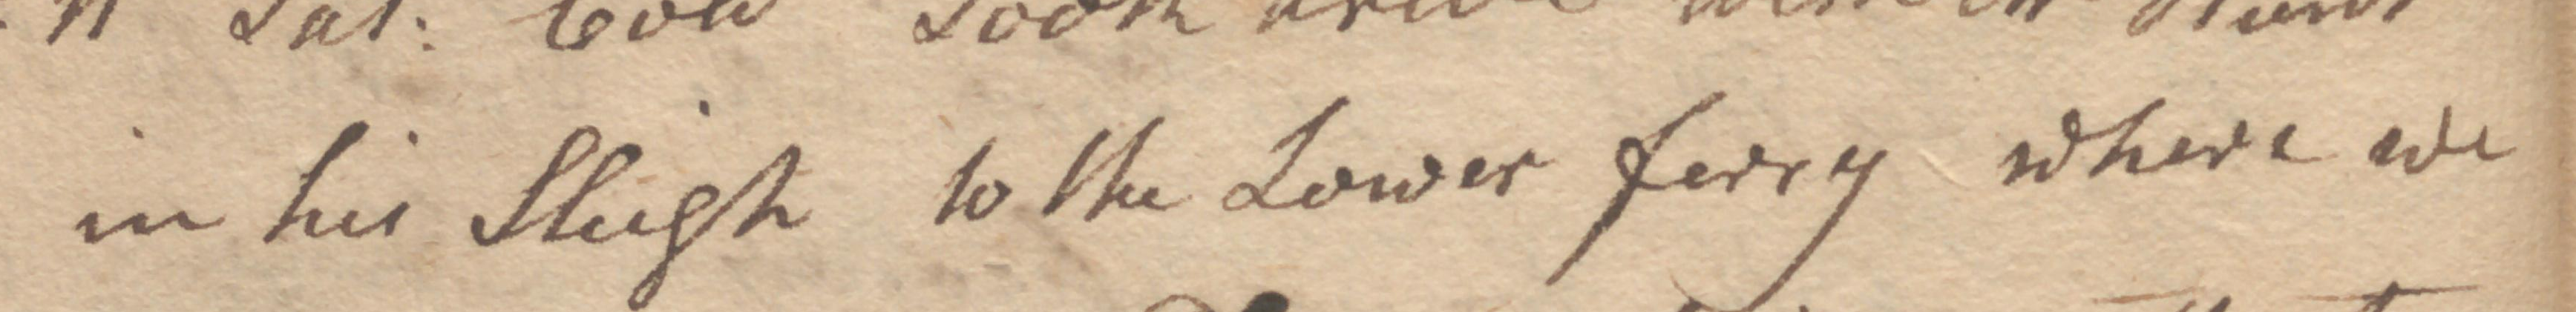in his Sleigh to the Lower ferry where we
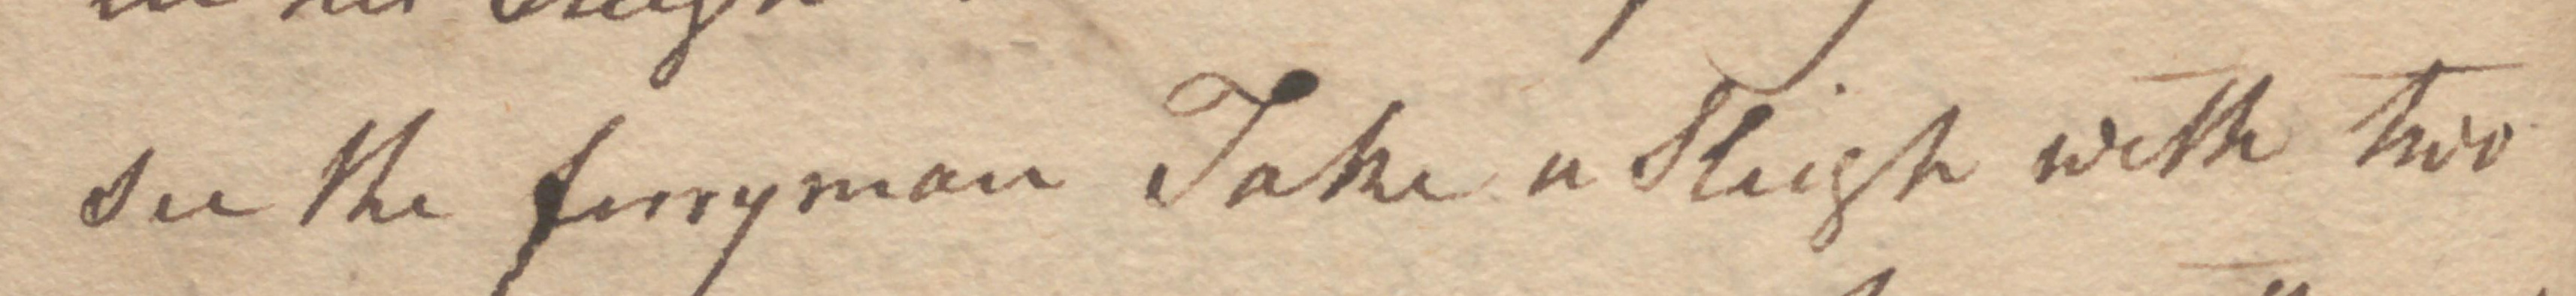see the ferryman Take a Sleigh with two
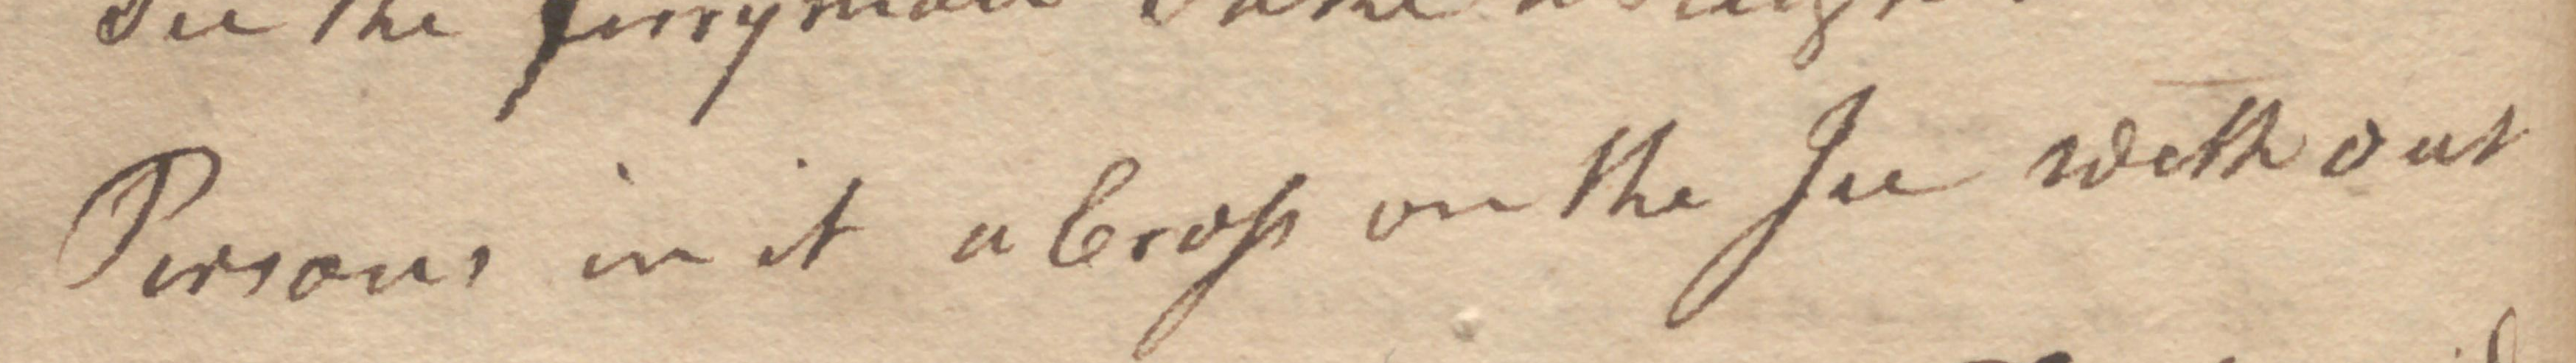Persons in it a Cross on the Ice with out
